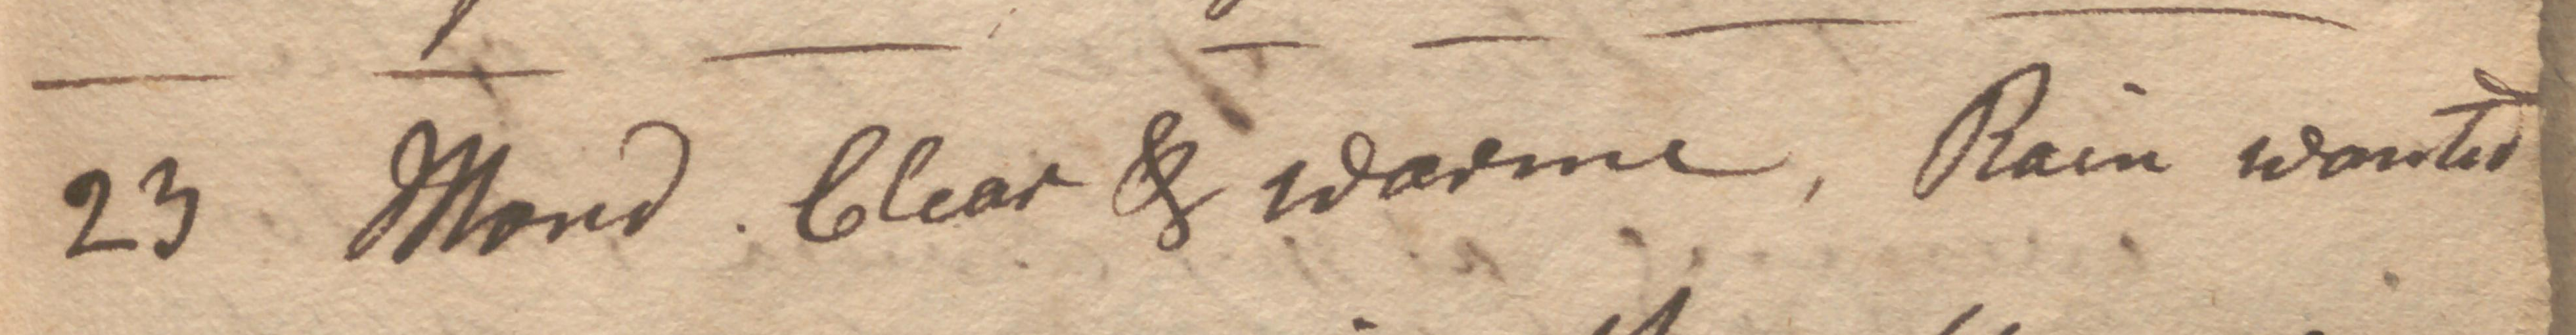23 Mond. Clear & warme, Rain wanted
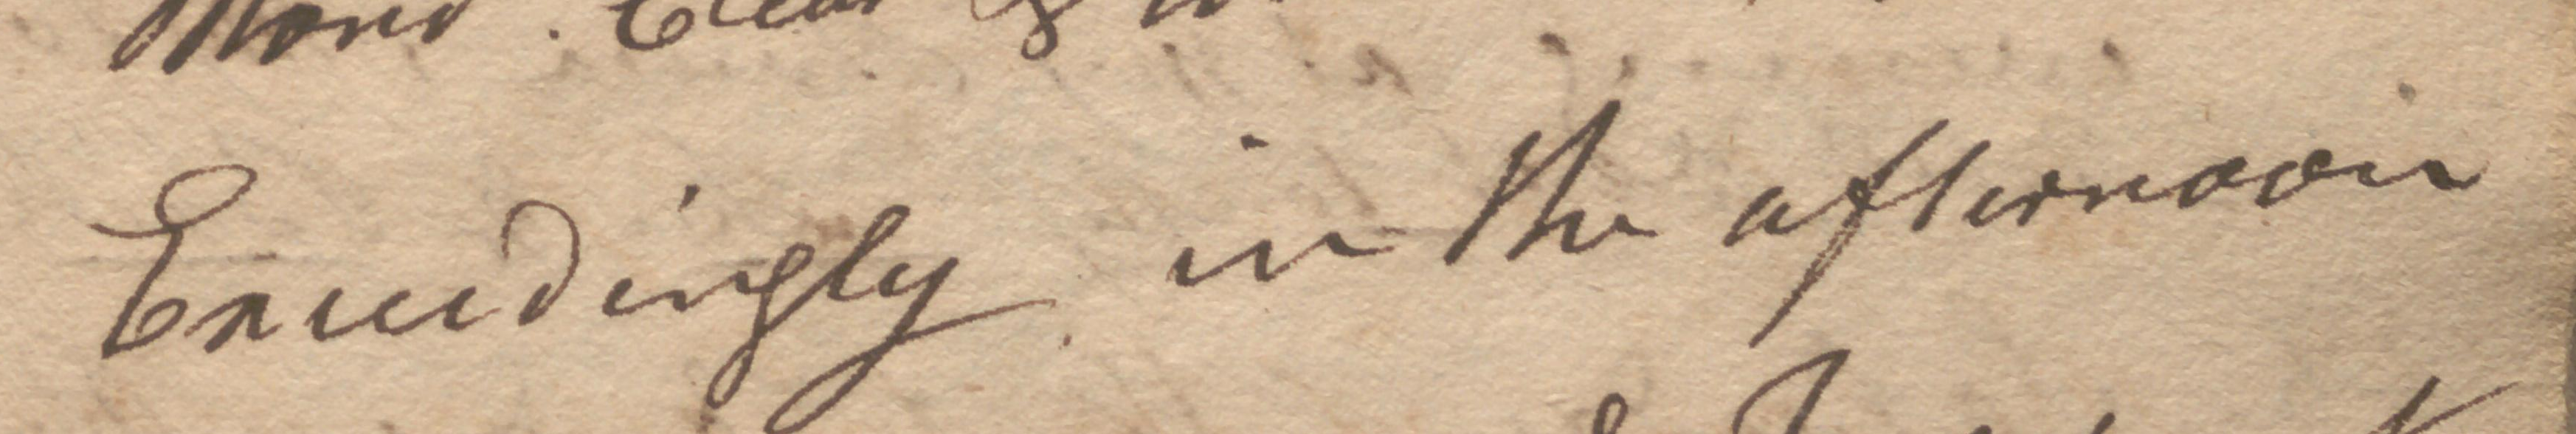Exceedingly in the afternoon
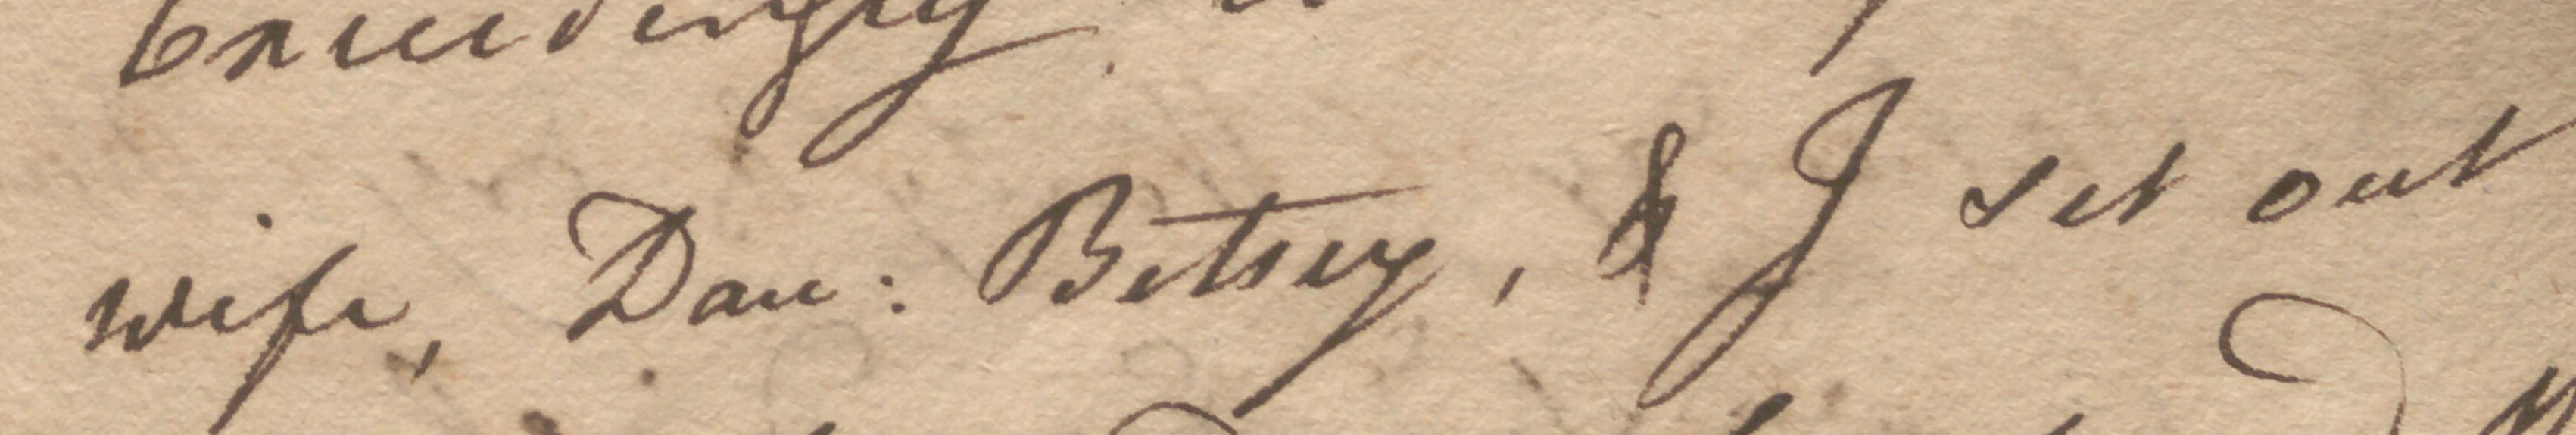wife Dau: Betsey, & I set out
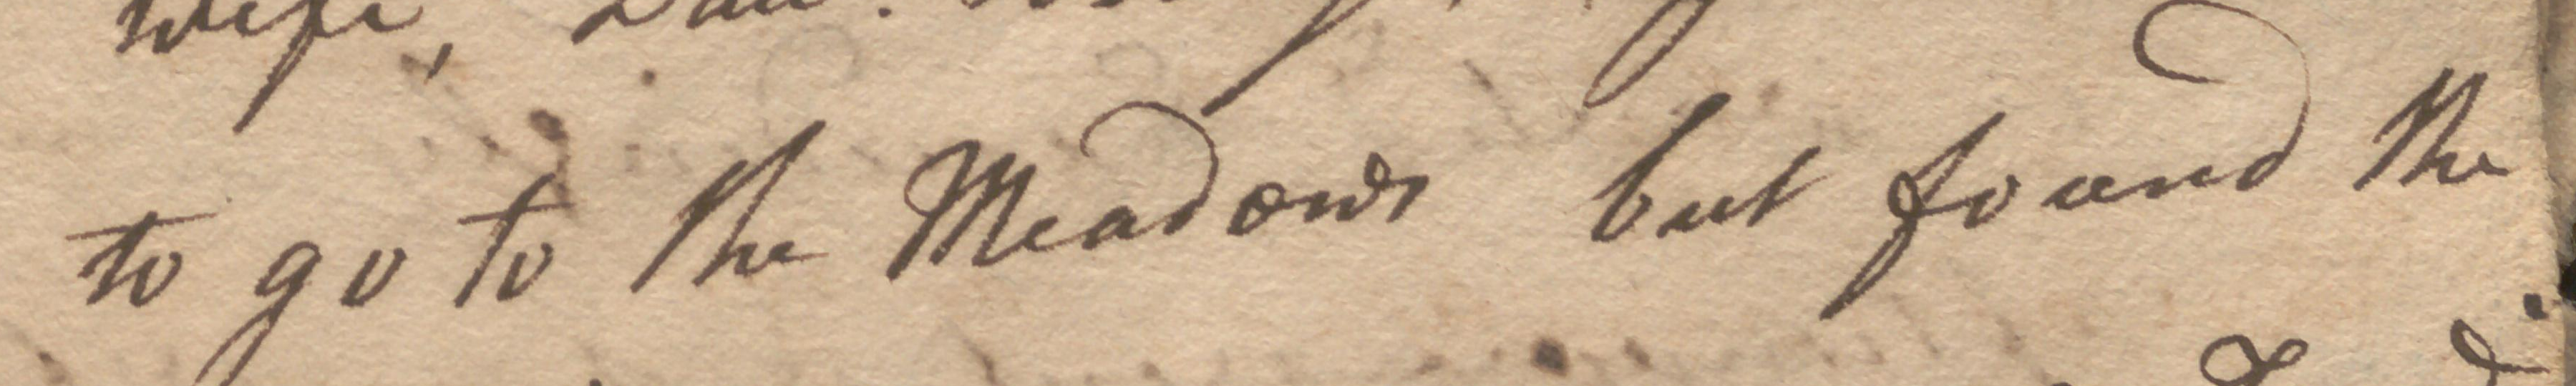to go to the Meadows but found the
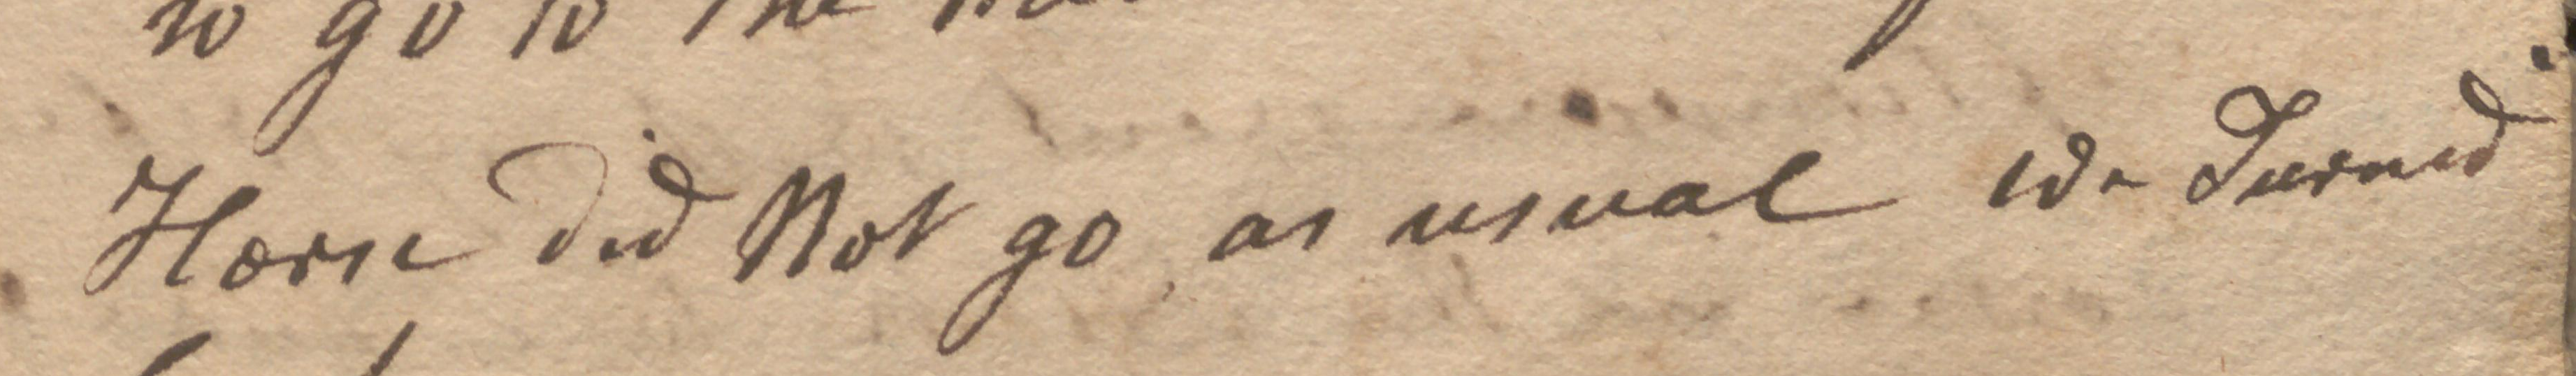Horse did Not go as usual we Turned
